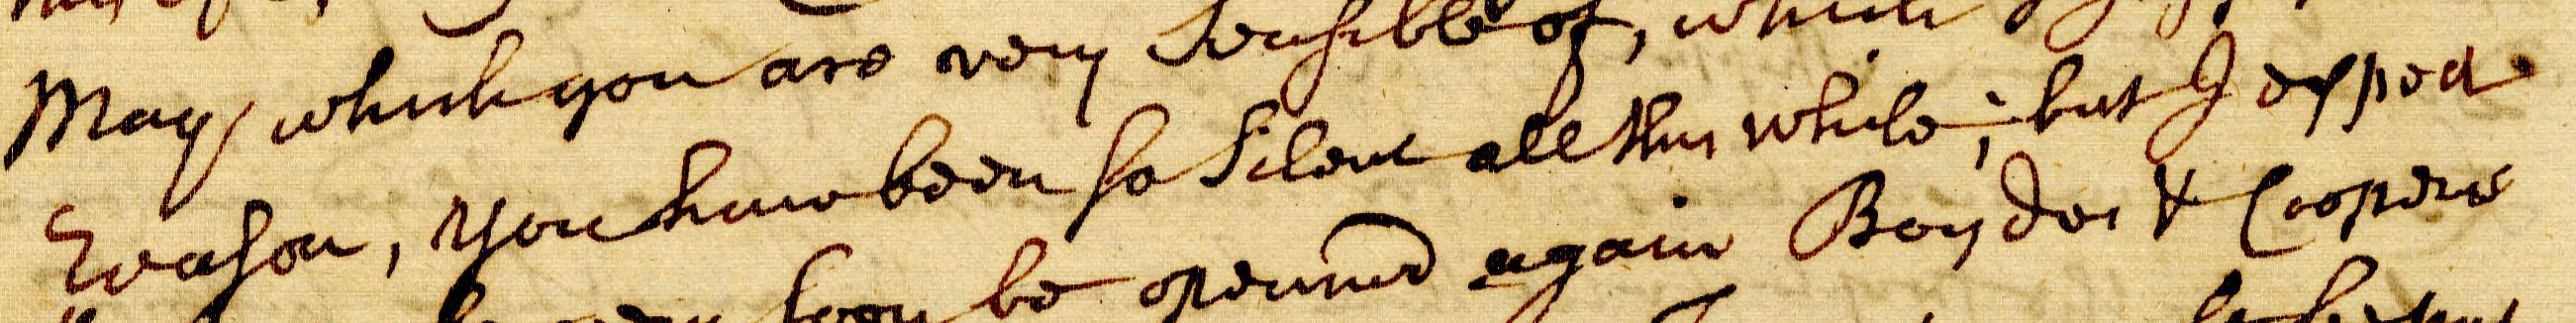reason, you have been so Silent all this while; but I expect
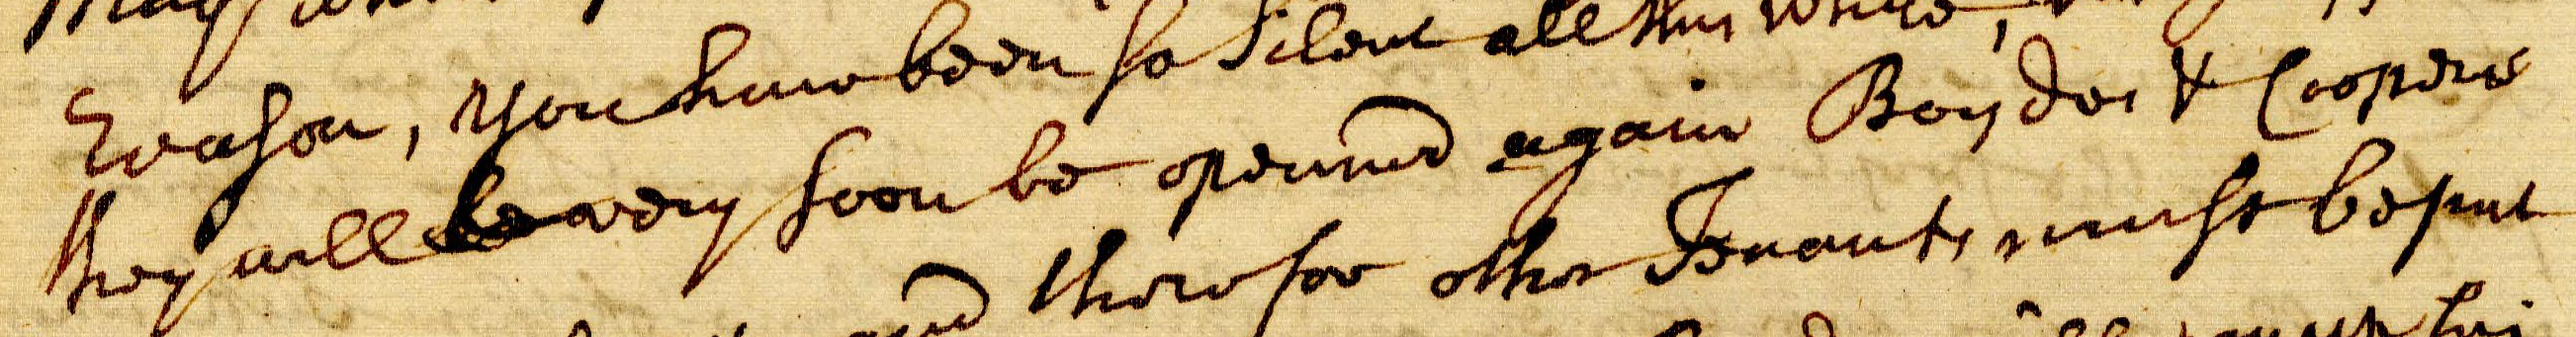they will [be] very soon be opened again Boydes & Coopers
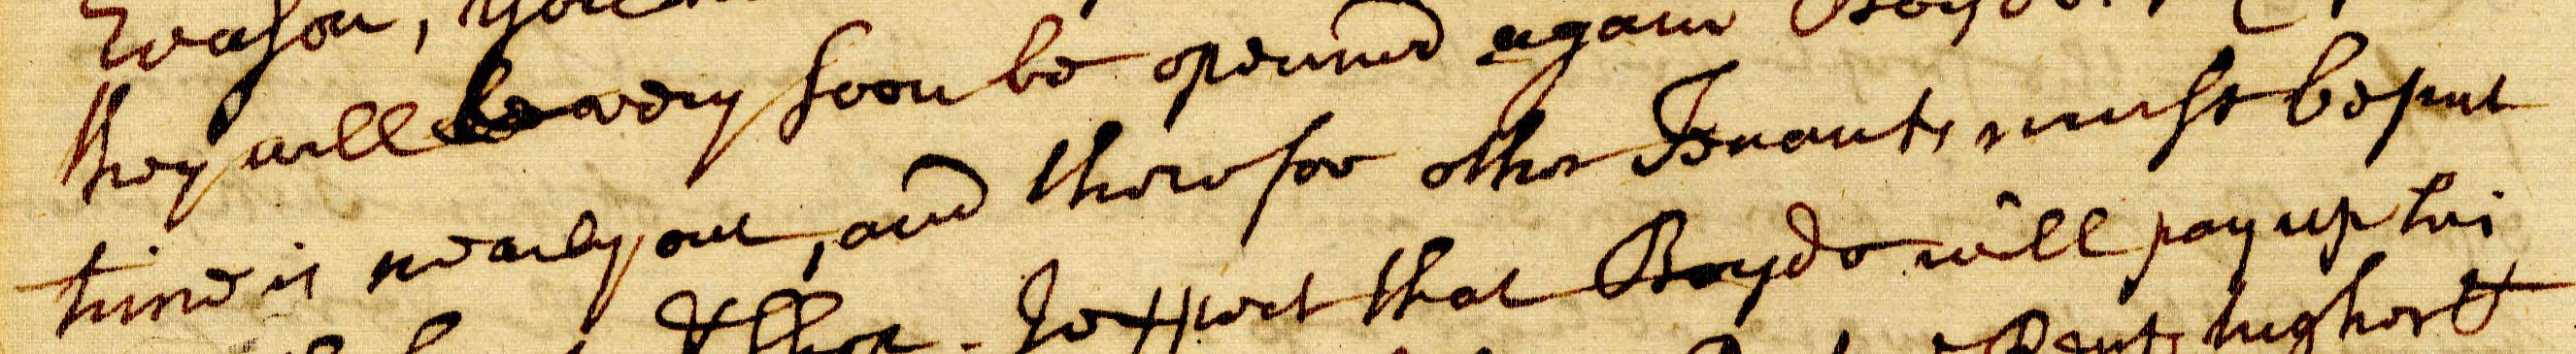time is nearly out, and therefor other Tenants meust be put
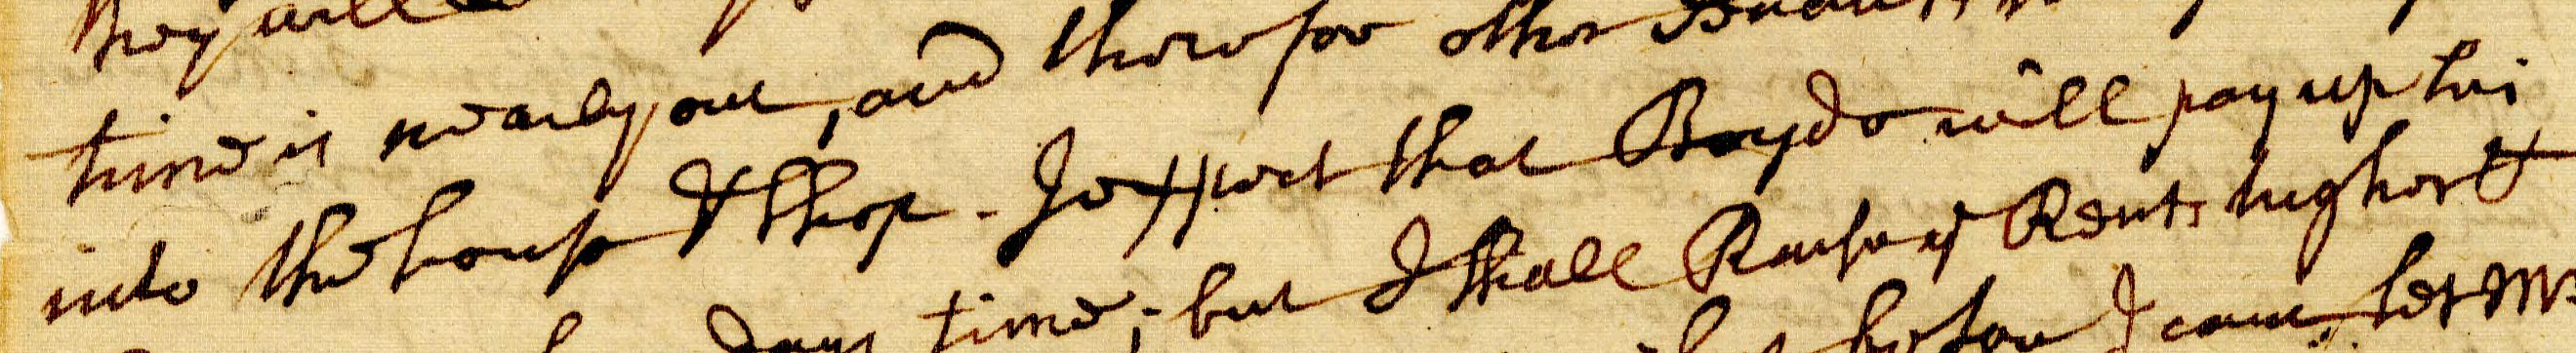into the house & Shop. I expect that Boyd will pay up his
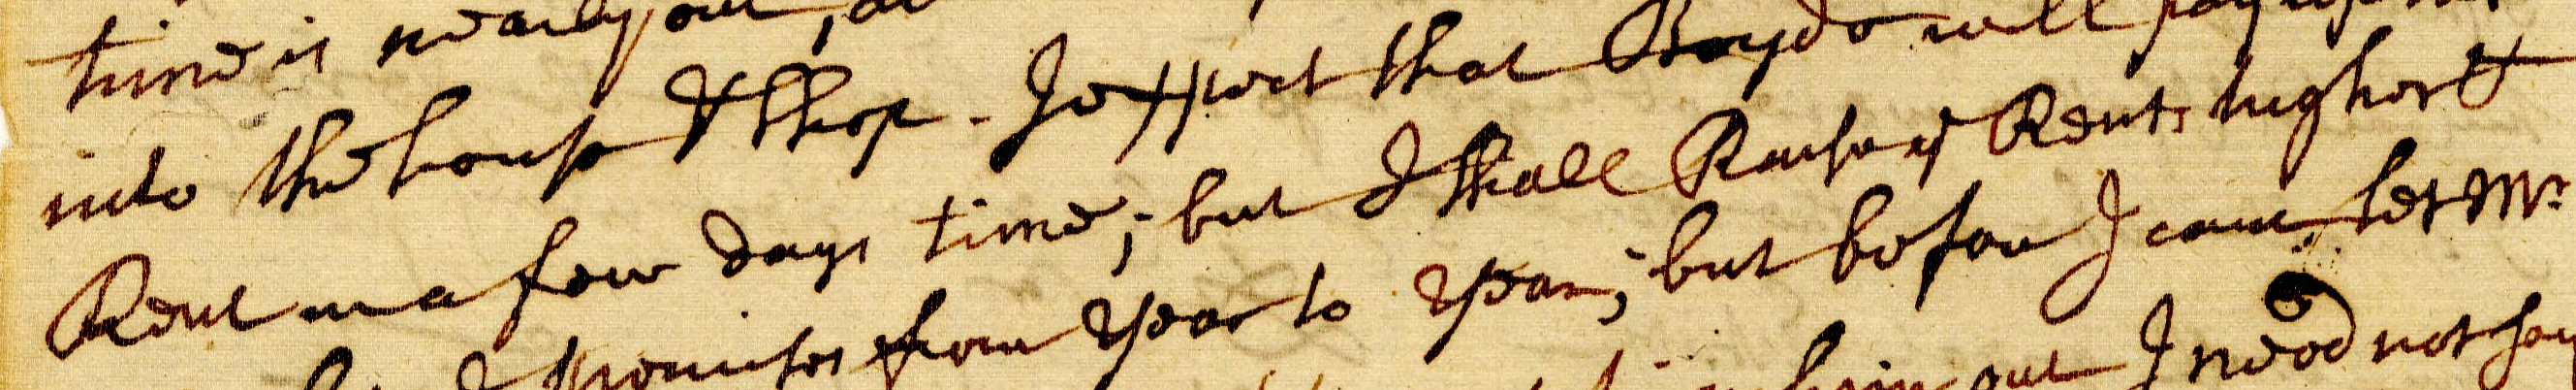Rent in a few days time; but I Shall Raise y^e Rents higher &
